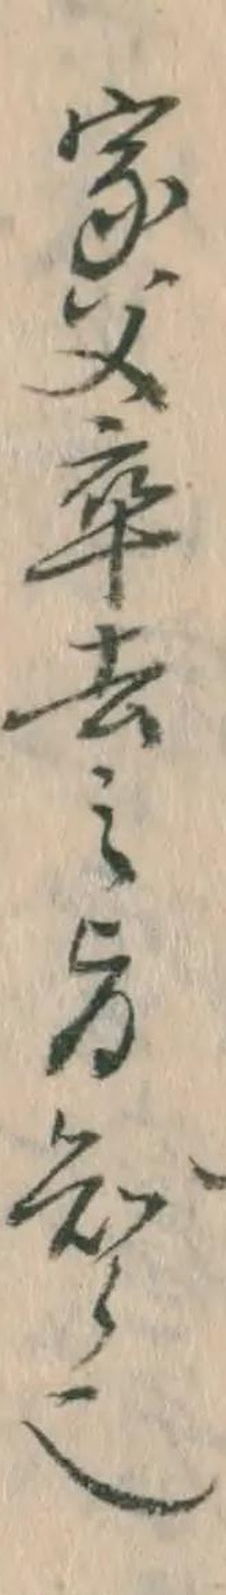家父卒去之旨知候也
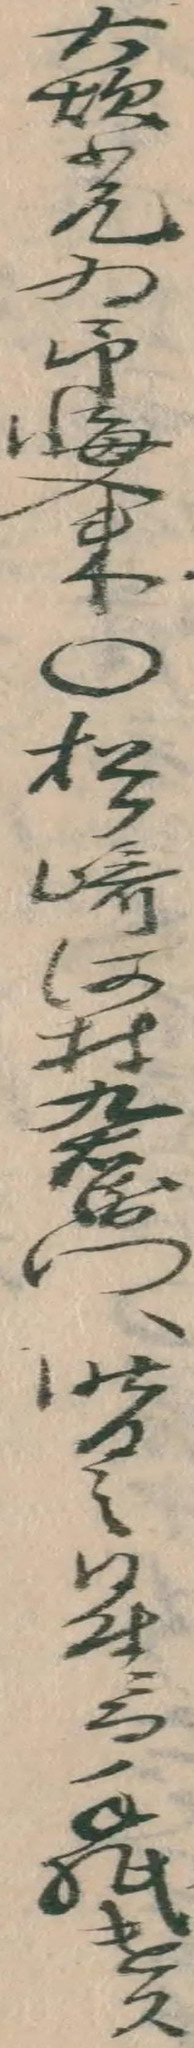大炊如元為弔悔入来〇松ケ崎河村九右衛門へ昨日之日付ニ而手紙遣ス
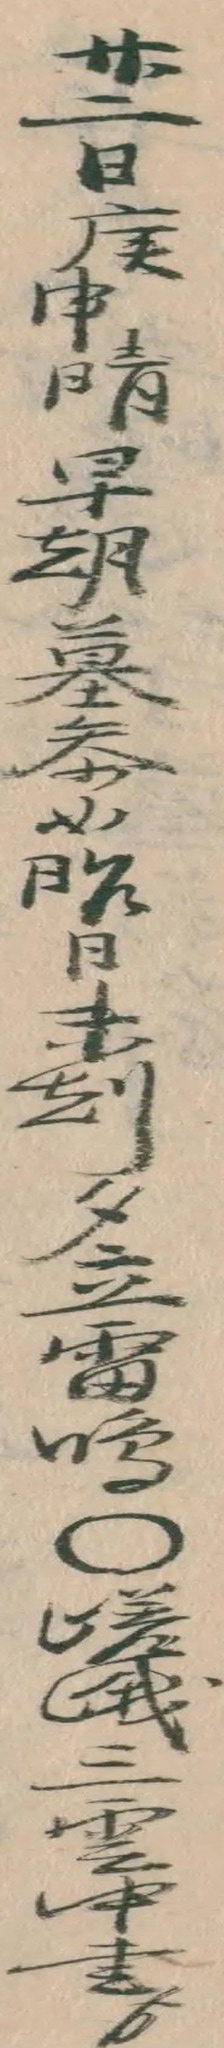廿二日庚申晴早朝墓参如昨日未刻夕立雷鳴○嵯峨三雲中書ゟ
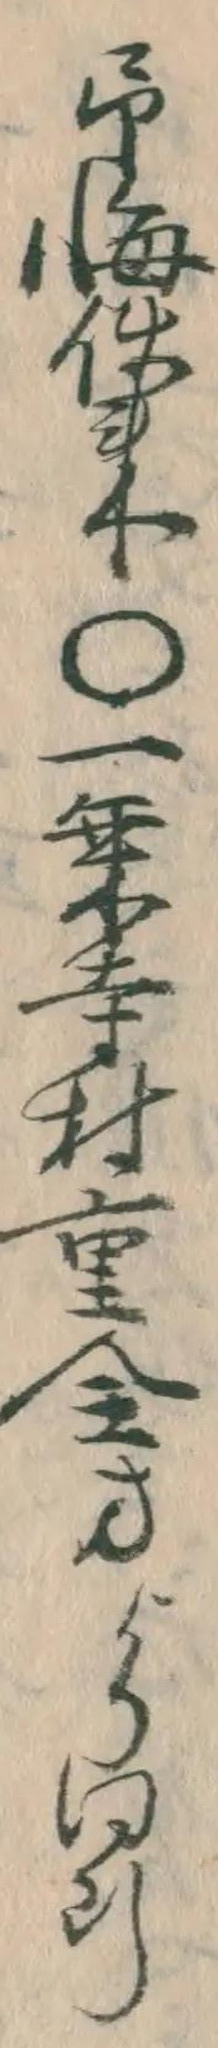弔悔使来○一乗寺村重金方より同断
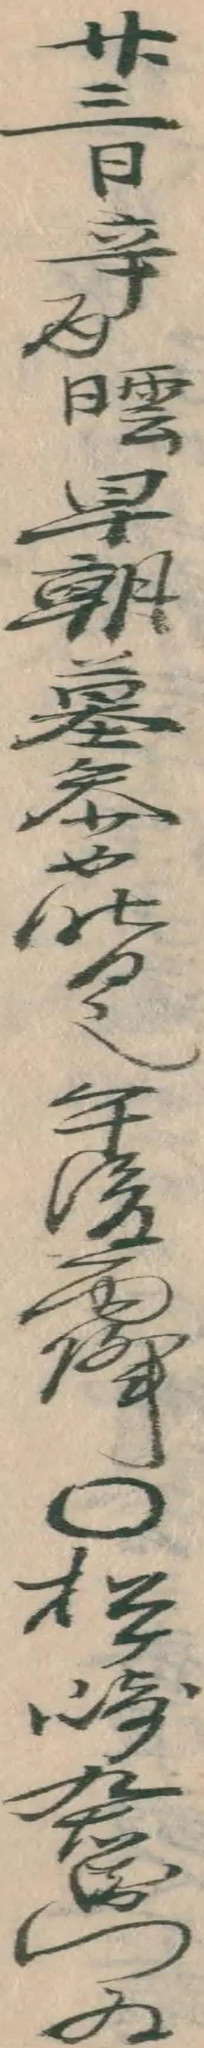廿三日辛酉曇早朝墓参如昨日也午後雨降〇松ヶ崎九右衛門為
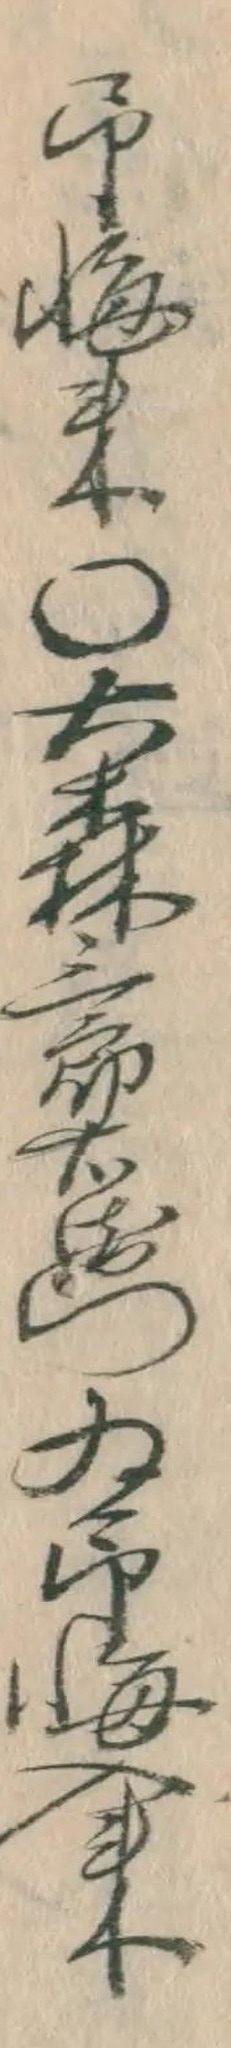弔悔来◯大森三郎右衛門為弔悔入来
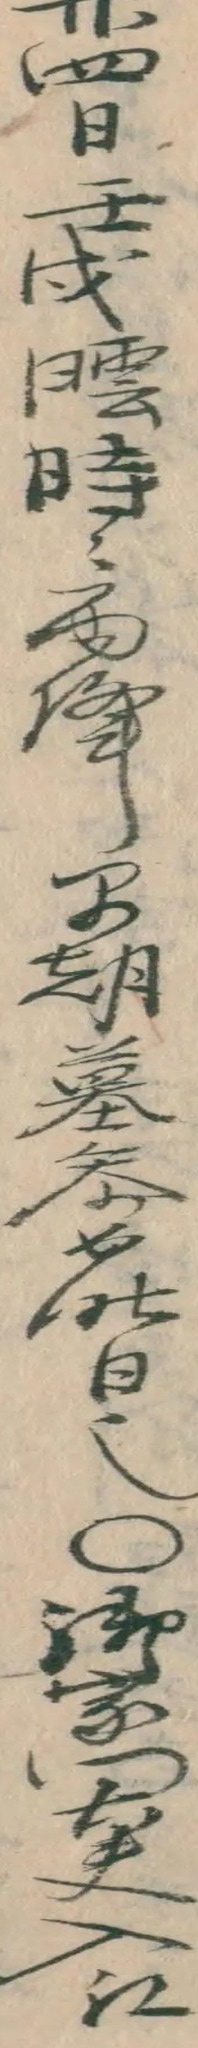廿四日壬戌曇時々雨降早朝墓参如昨日也○御家門大夫入江
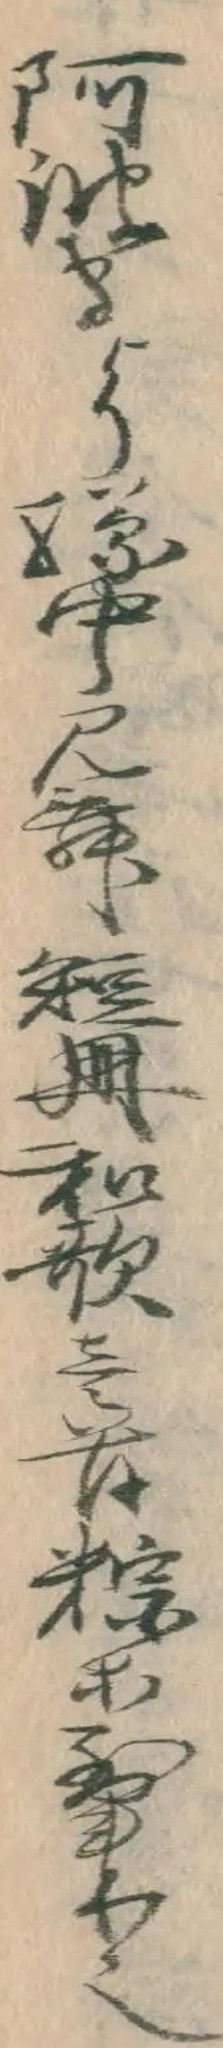阿波守より縁中見舞短冊和歌壱首粽等到来也

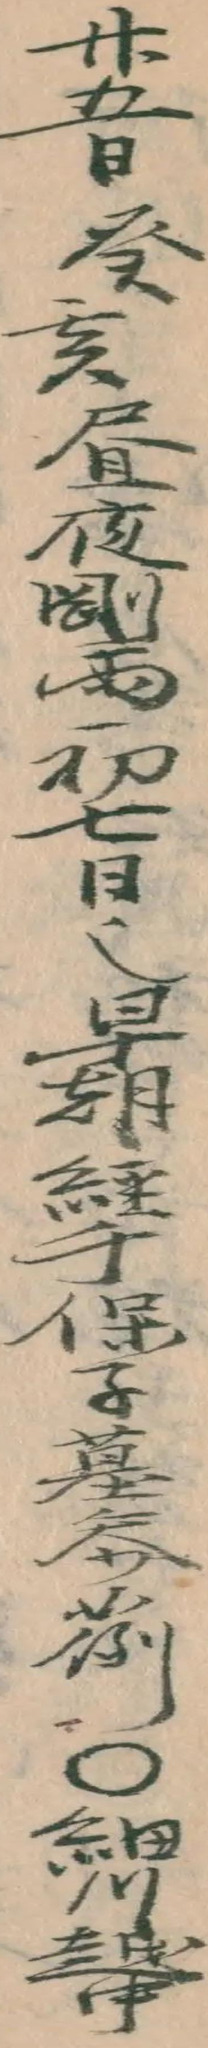廿五日癸亥昼夜剛雨初七日也早朝経千保子墓参如例○細川越中
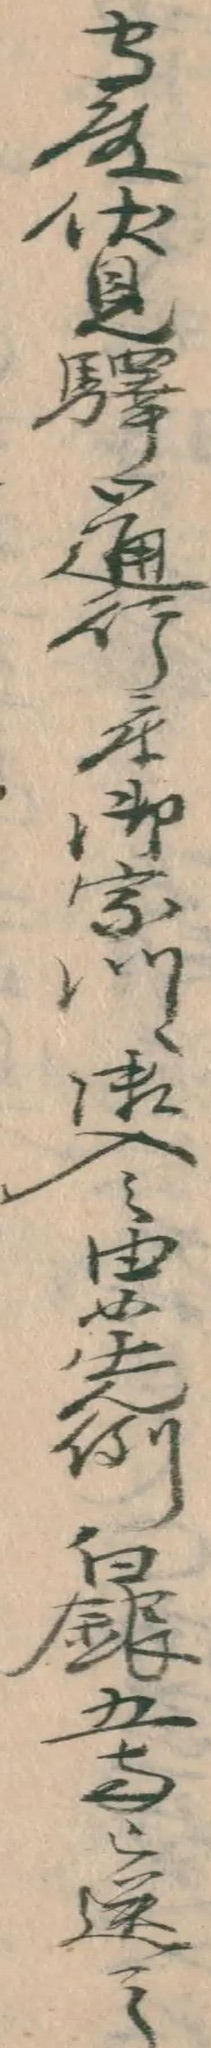守殿伏見驛御通行ニ付御家門へ御入之由如先例白銀五両被送之
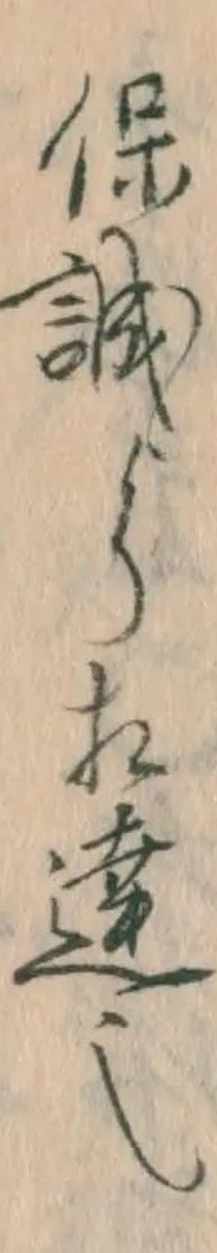保誠より相達也
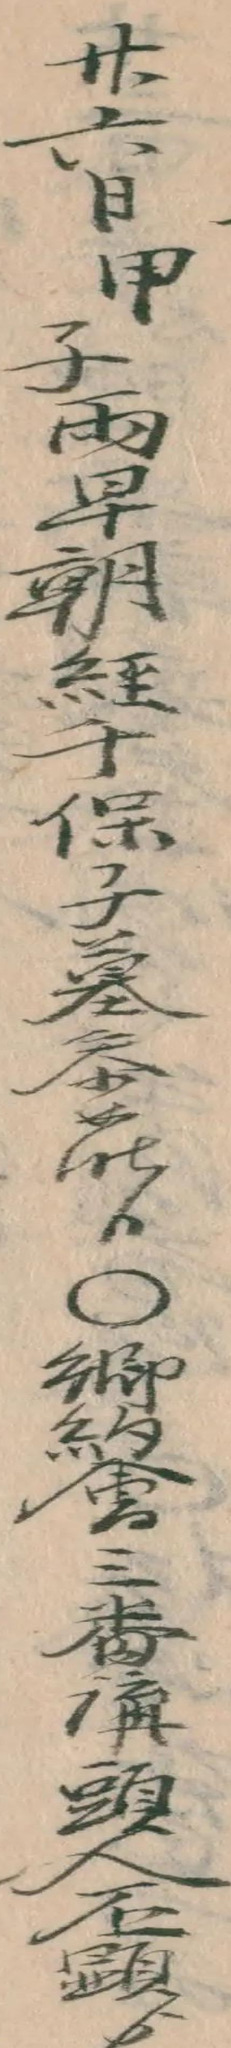廿六日甲子雨早朝経千保子墓参如前日〇郷約會三番講頭人丕顕ゟ
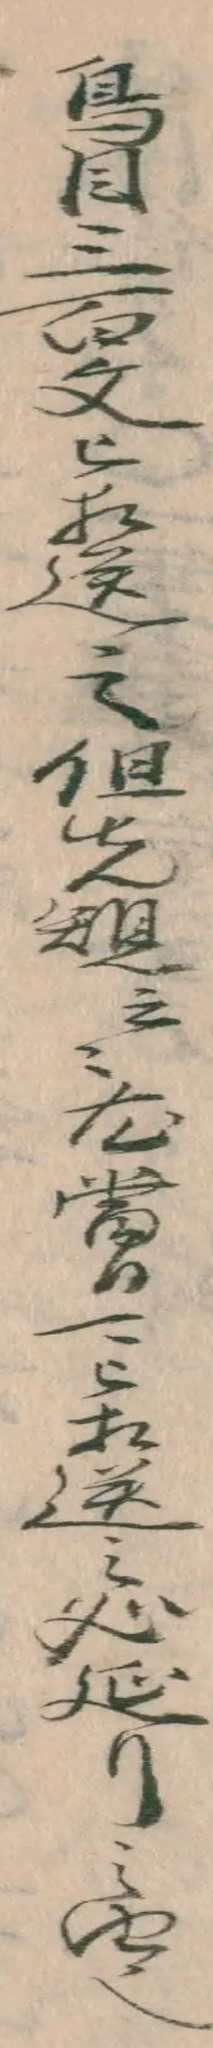鳥目三百文被相送之但先規云々尤當日可被相送之処延引之由也
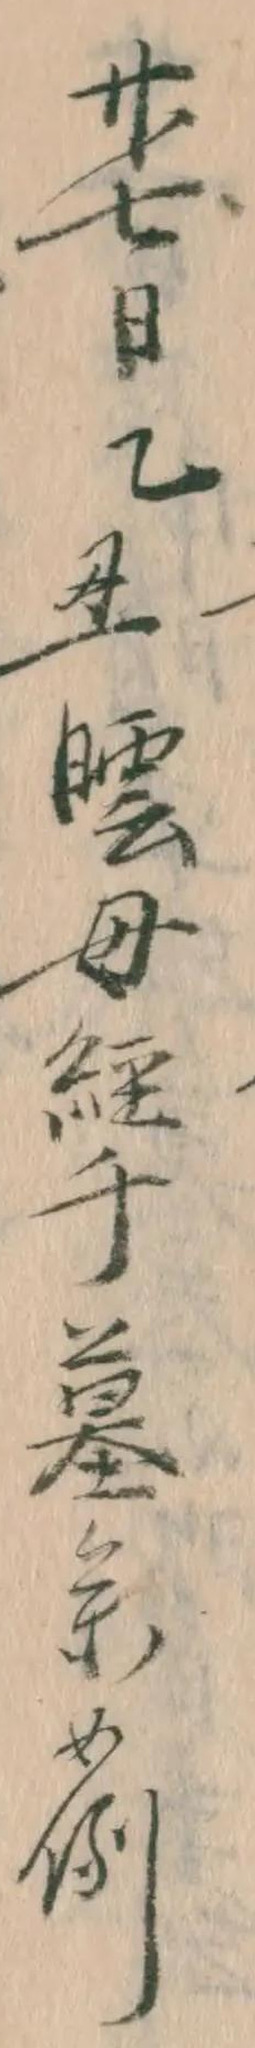廿七日乙丑曇母経千墓参如例
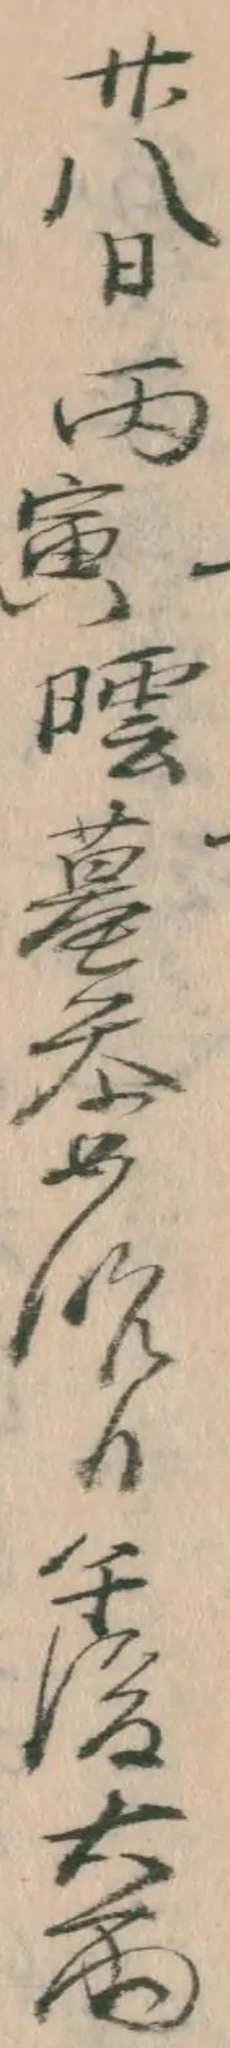廿八日丙寅曇墓参如昨日午後大雨
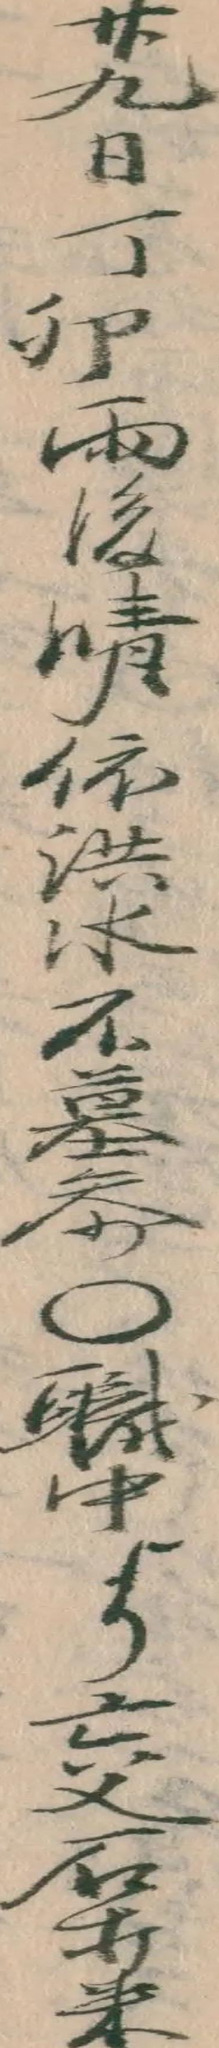廿九日丁卯雨後晴依洪水不墓参〇職中より亡父石打米
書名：賀茂社記録. 第65冊
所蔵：国立国会図書館 National Diet Library, JAPAN
